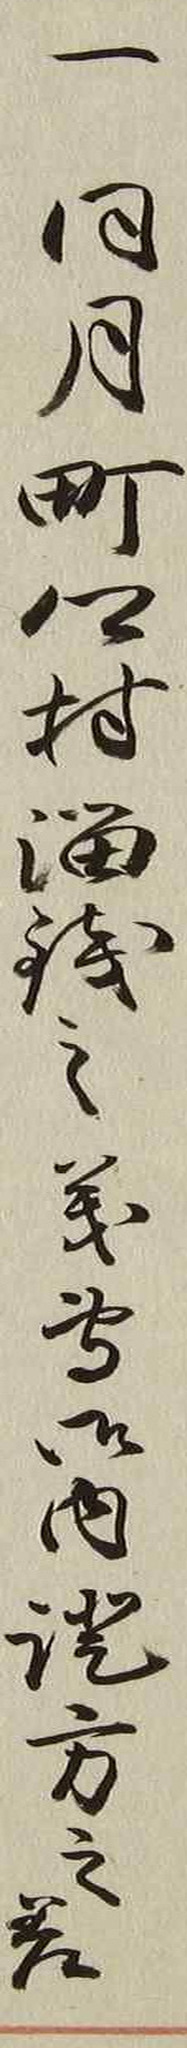一同月町郷村溜銭之義専御内証方之差
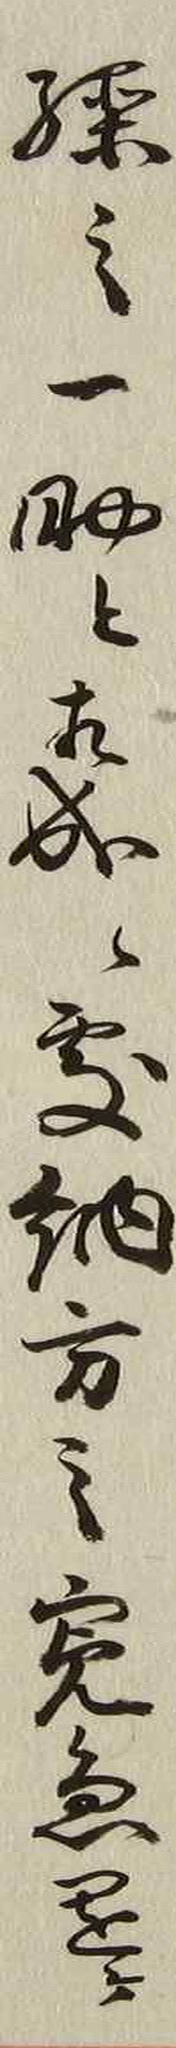繰之一助と相成候処納方之寛急懸ケ
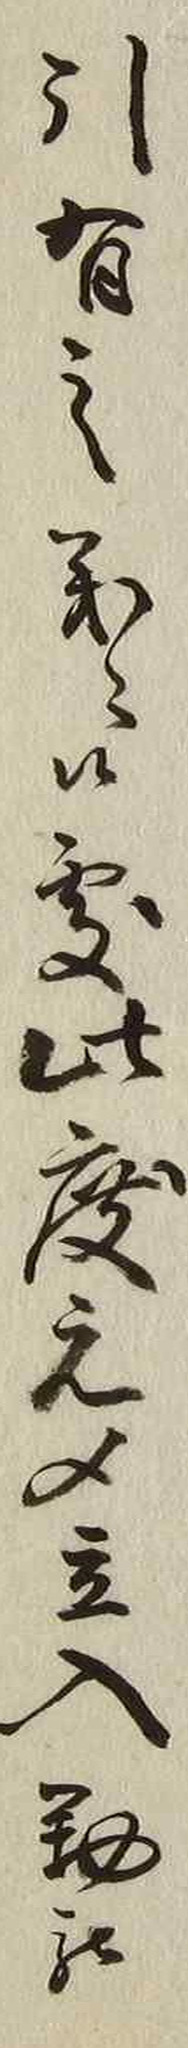引有之義ニ候処此度元〆立入勤被
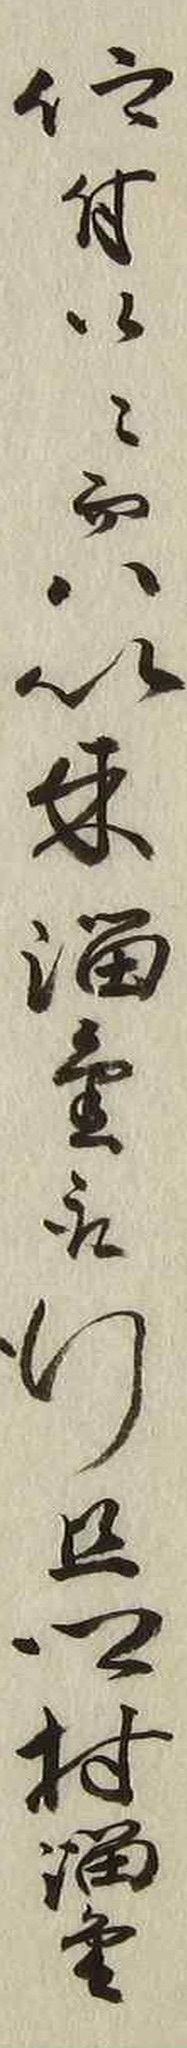仰付候ニ而ハ以来溜金取行且郷村溜金
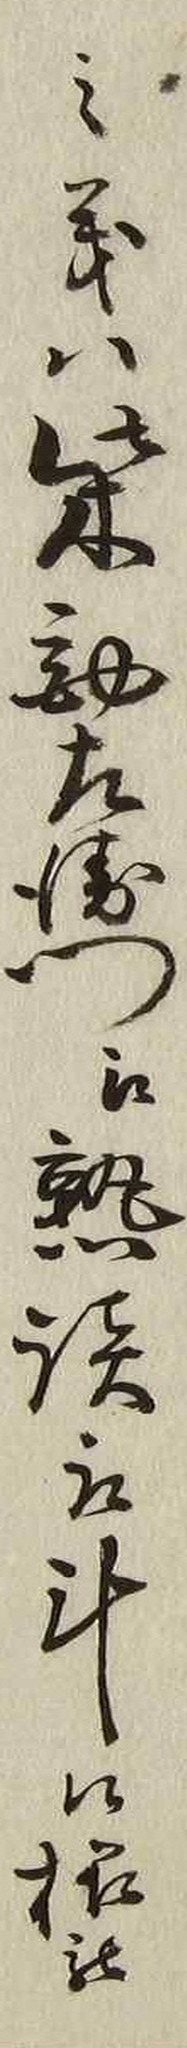之義ハ柴勘左衛門江熟談取計候様被
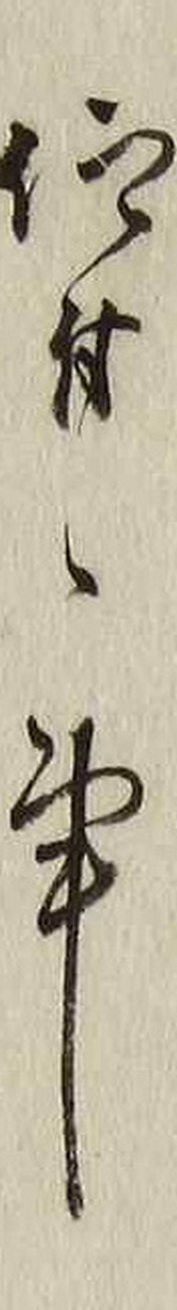仰付候事
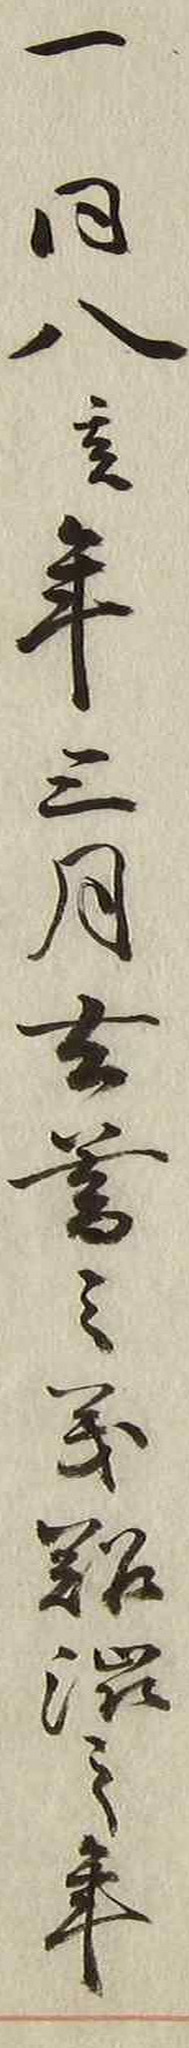一同八亥年三月去暮之義難渋之年
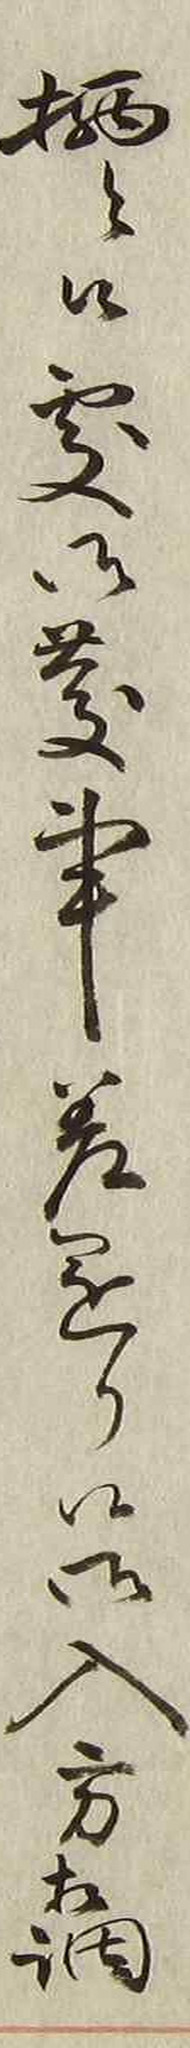柄と候処御慶事差懸り候御入方相調
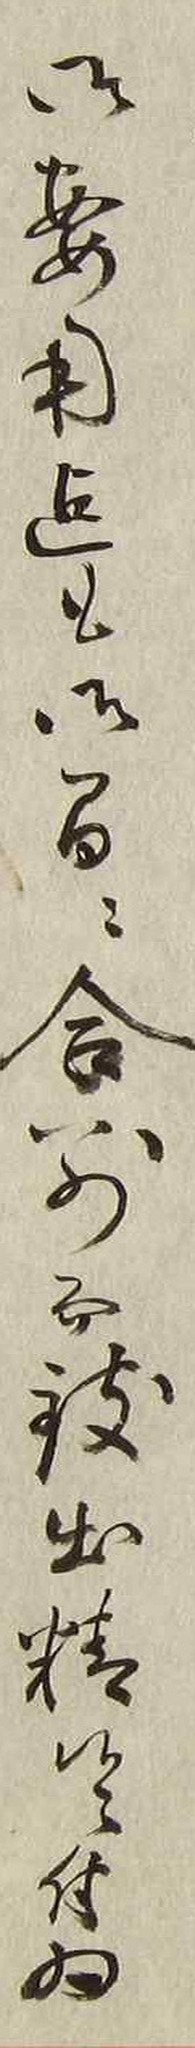御要用迄も御間ニ合別而致出精ニ付為
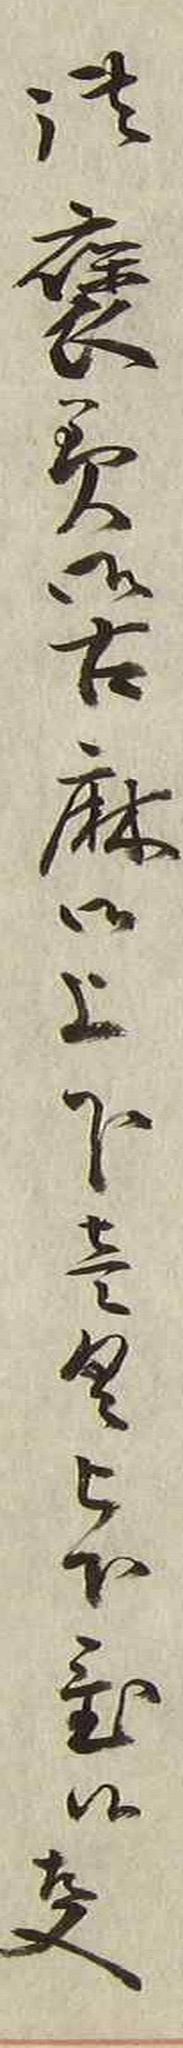御褒美御古麻御上下壱具被下置候事

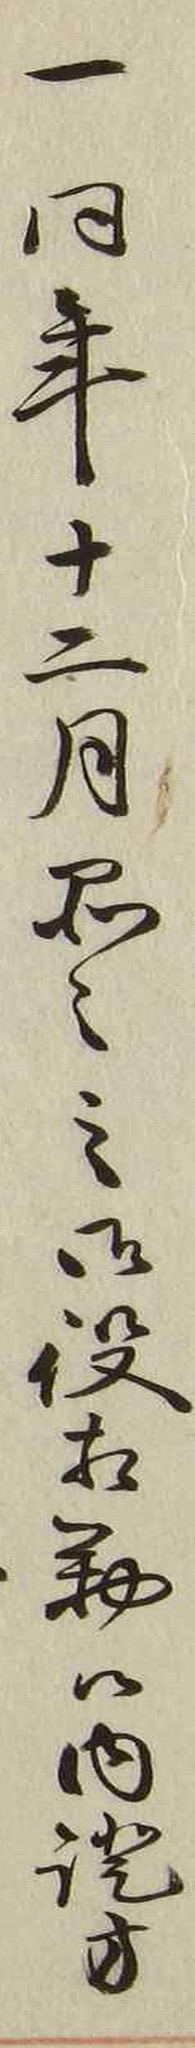一同年十二月品々之御役相勤御内証方
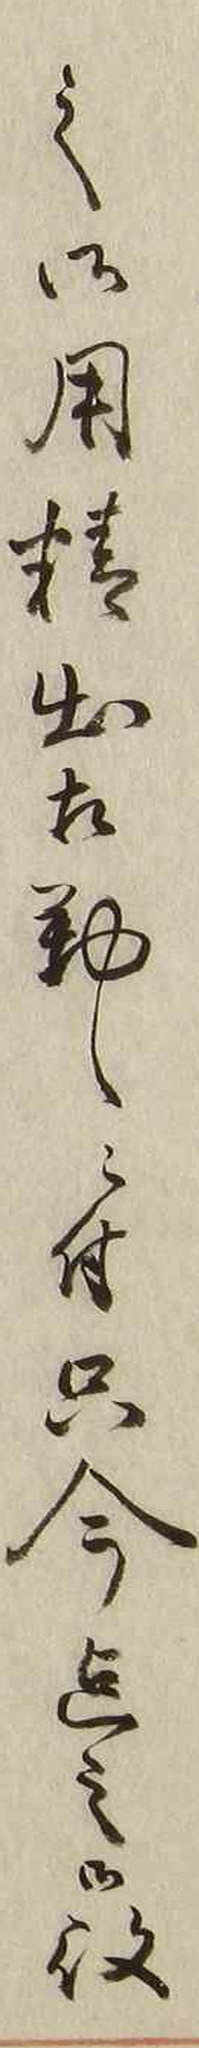之御用精出相勤候ニ付只今迄之御役
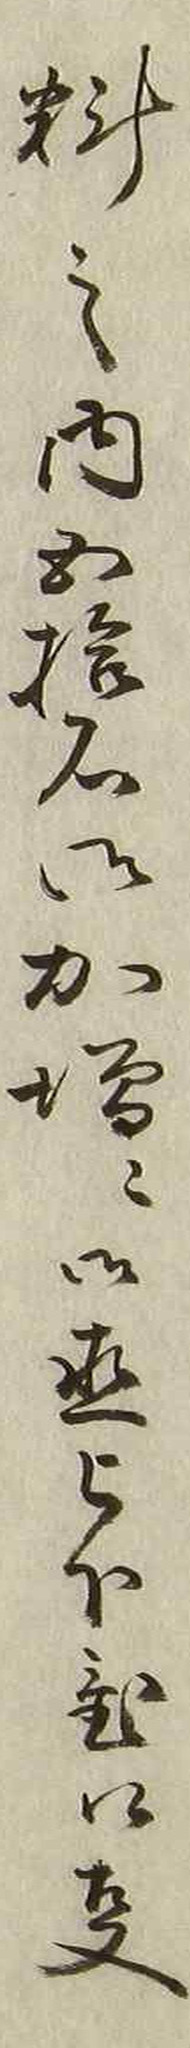料之内五拾石御加増ニ御直被下置候事
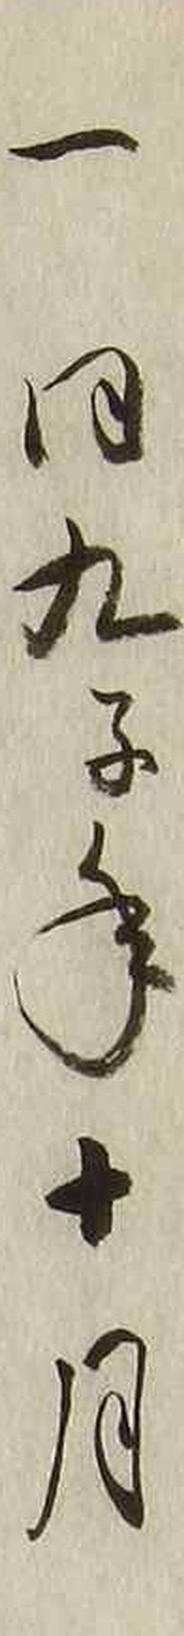一同九子年十月
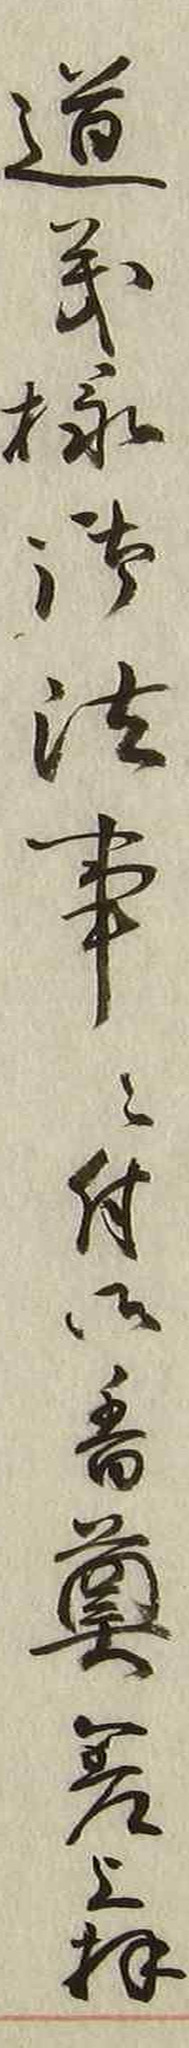道義様御法事ニ付御香奠差上拝
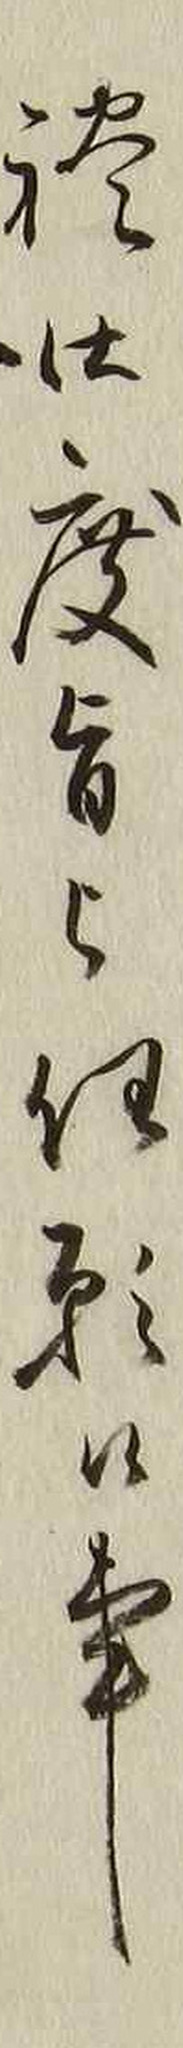礼仕度旨被任願候事
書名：諸士系譜　巻之15　い之部15
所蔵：会津若松市立会津図書館
